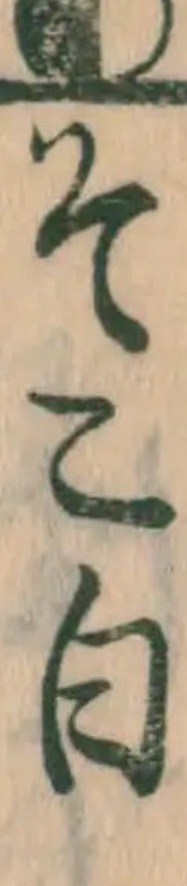そこ白
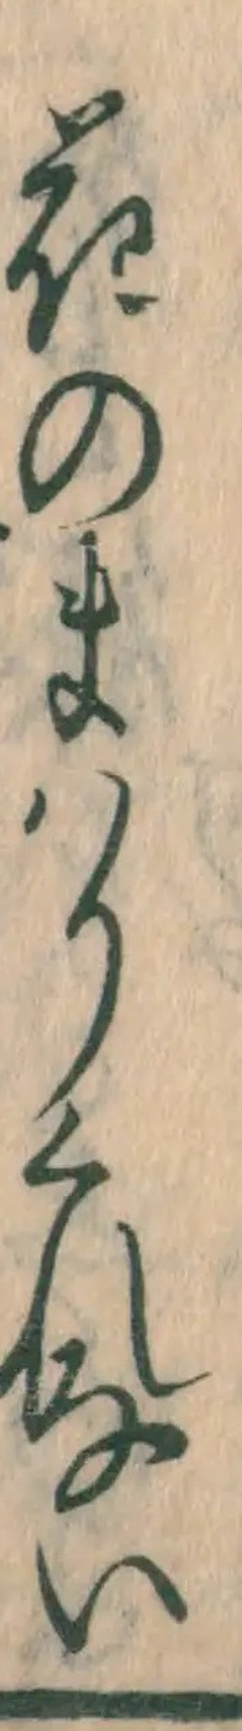花のまはりくれない
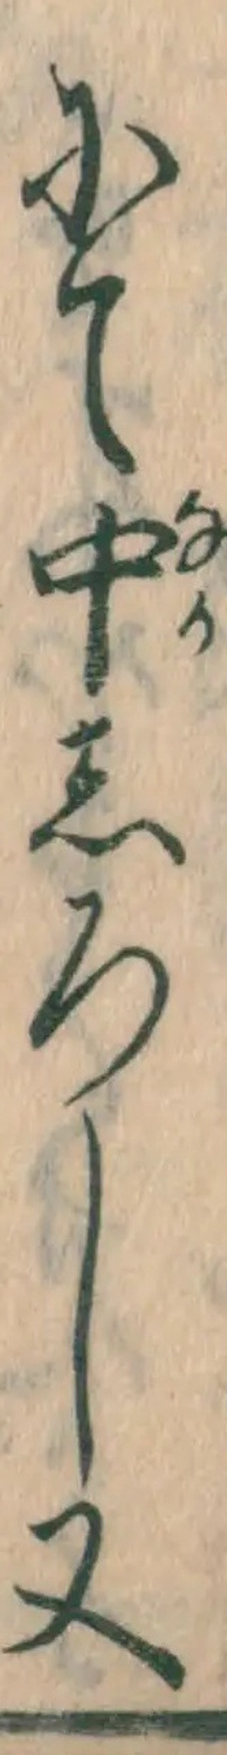にて中しろし又
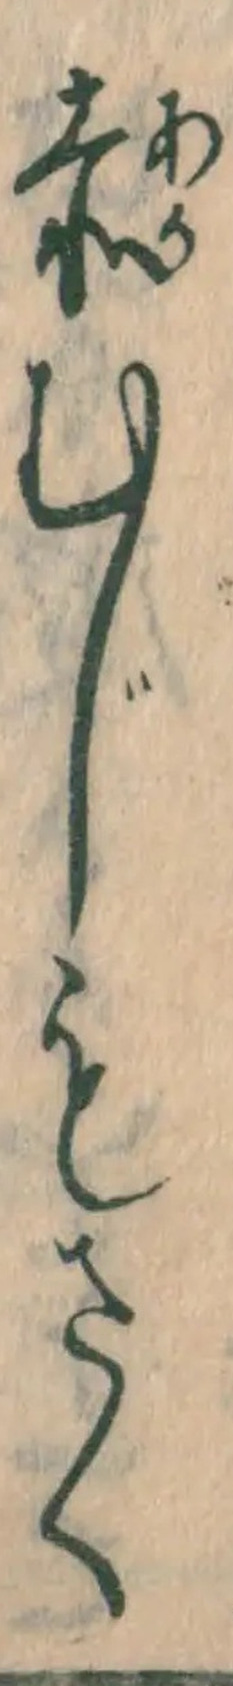赤むじもさく

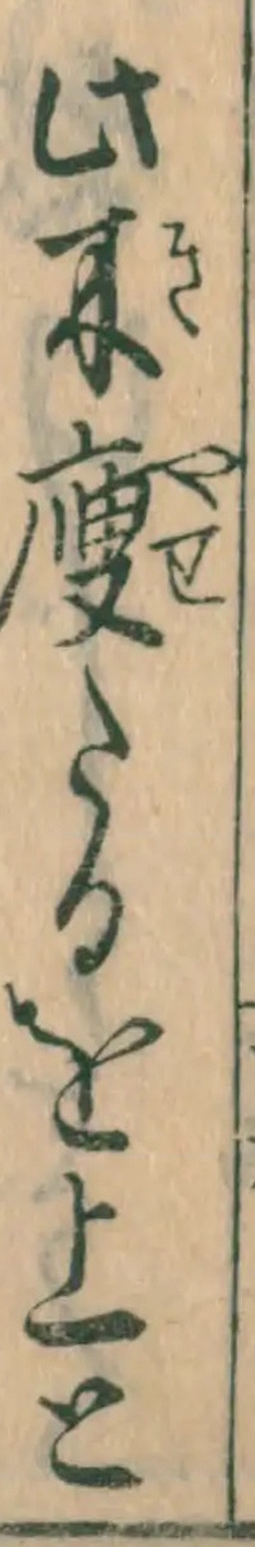此木痩たるを上と
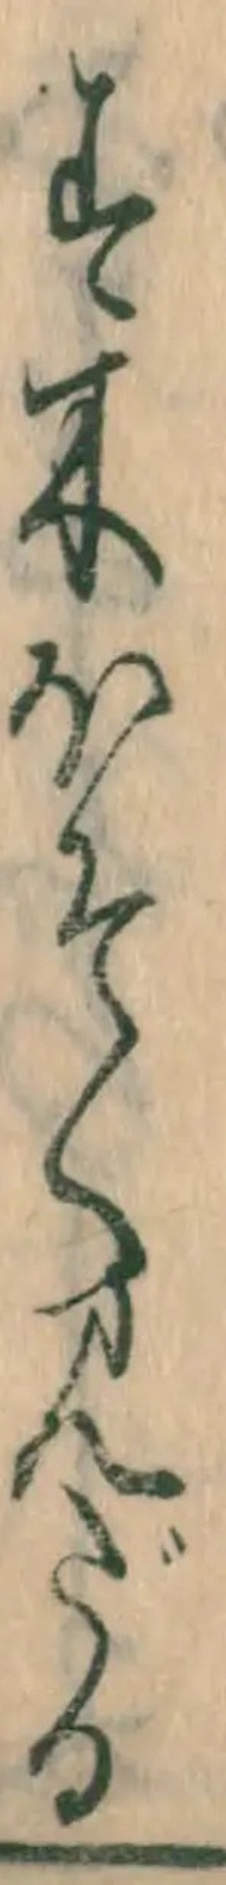す木ほそくみだる
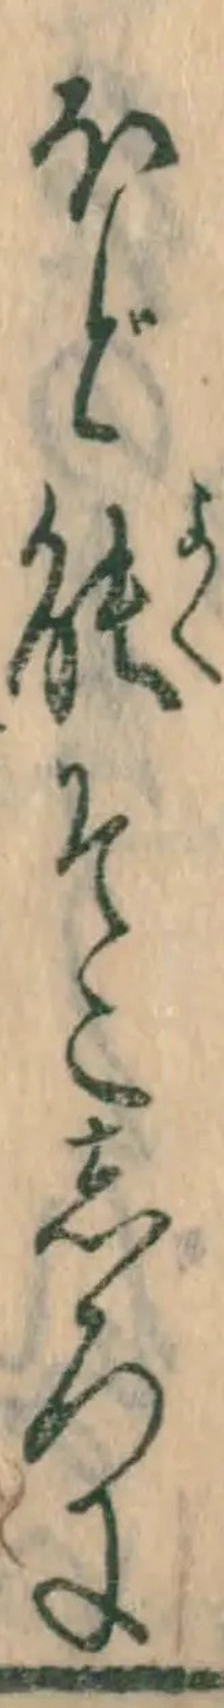ほど能そこしろに
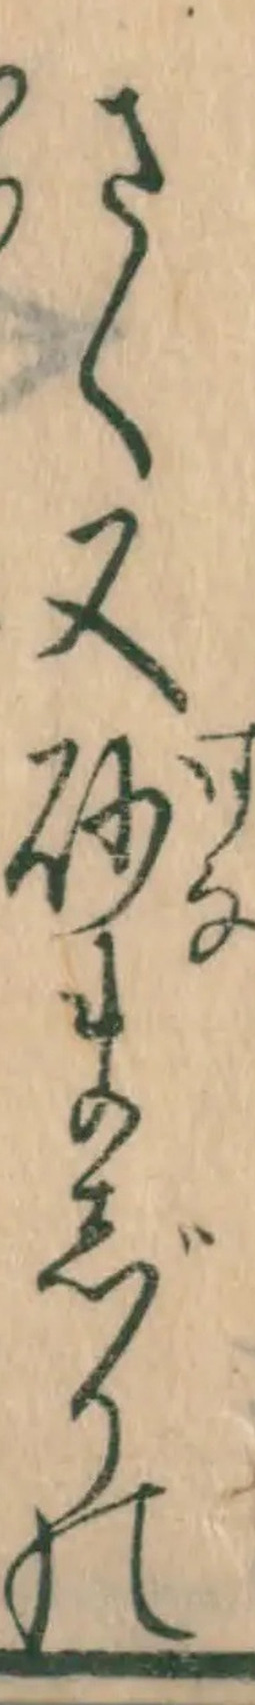さく又砂まじりの
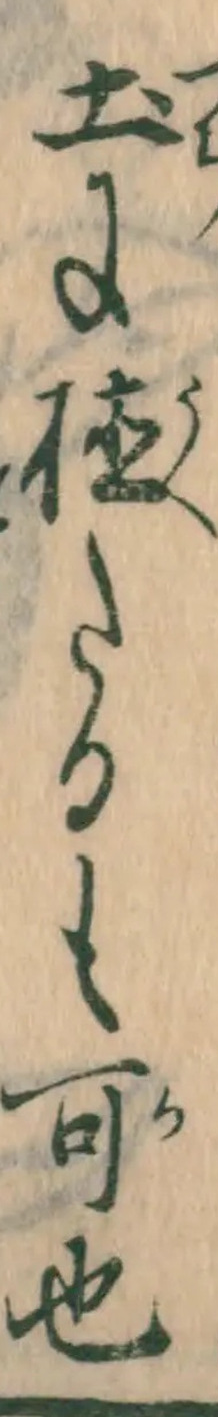土に植たるも可也
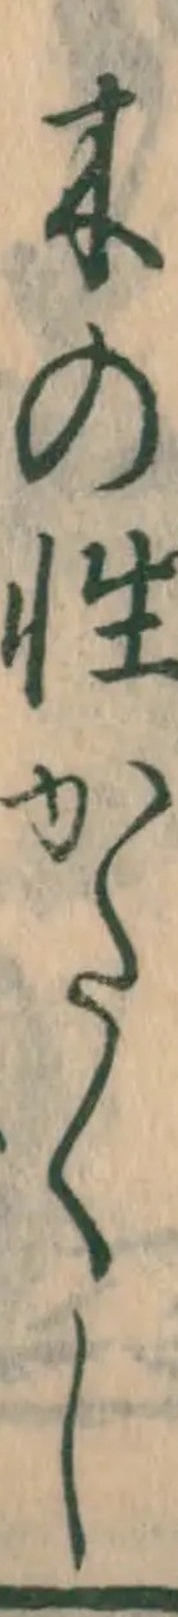木の性かたくし
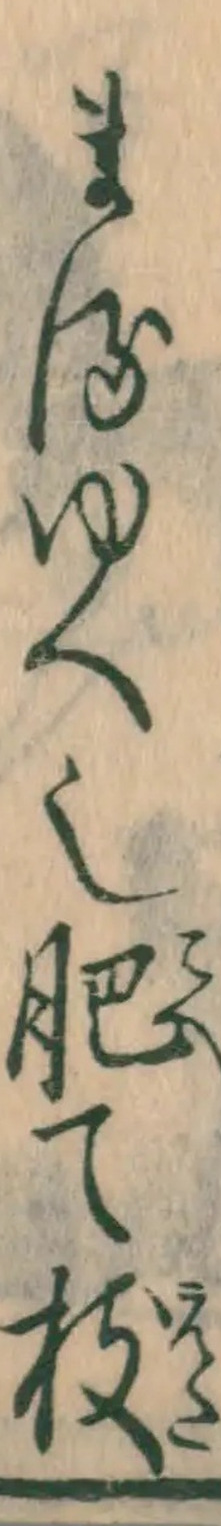まるゆへ也肥て枝
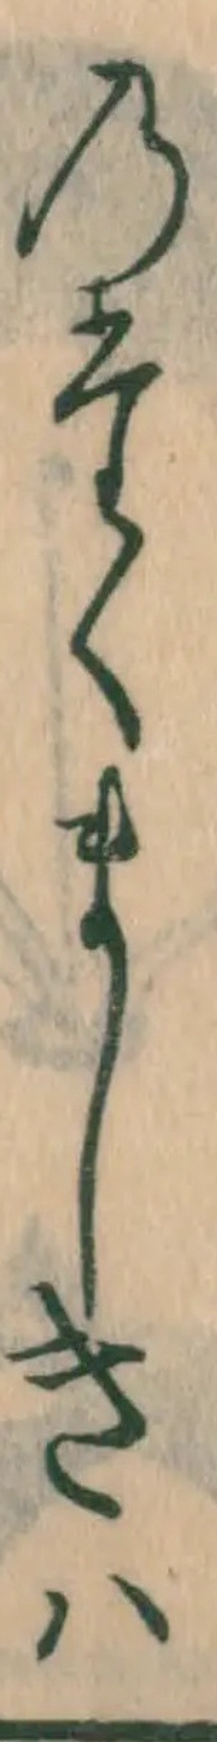のたくましきは
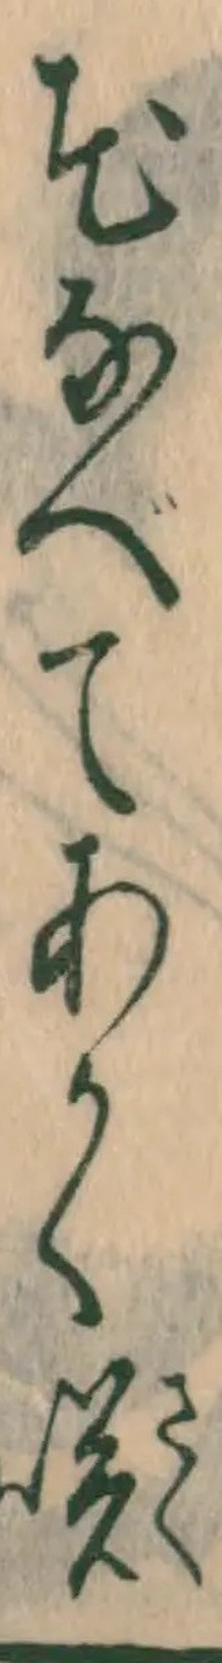花なべてあかく咲
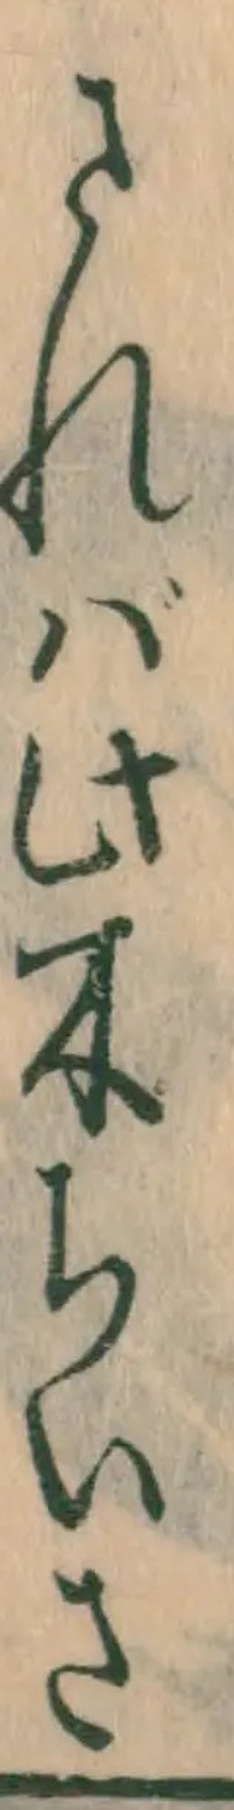されば此木ちいさ
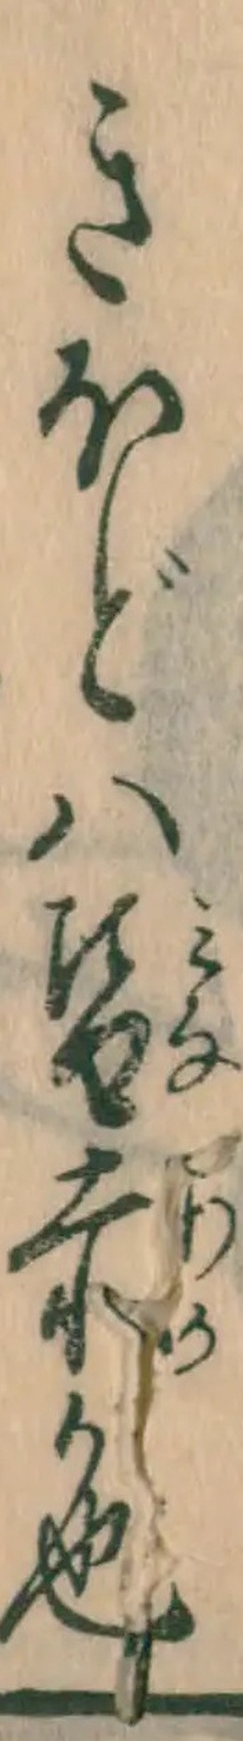きほどは皆赤色
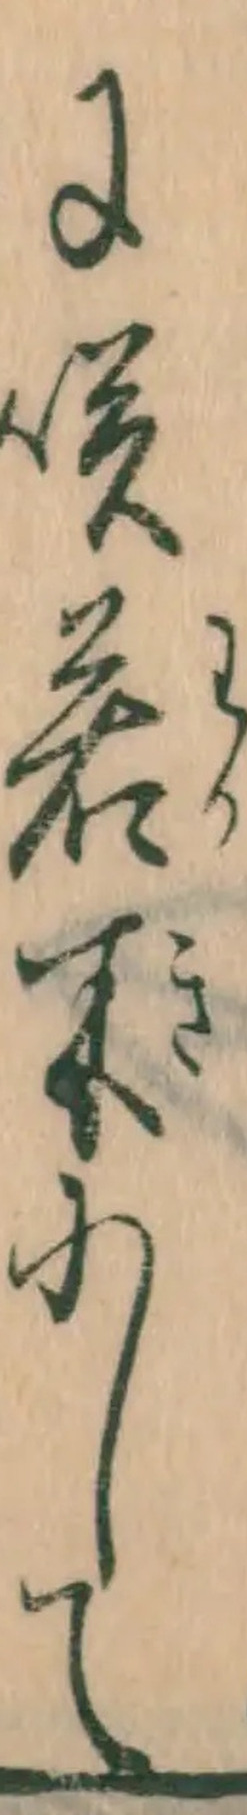に咲若木にして
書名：錦繍枕 5巻. [4]
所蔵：国立国会図書館 National Diet Library, JAPAN
